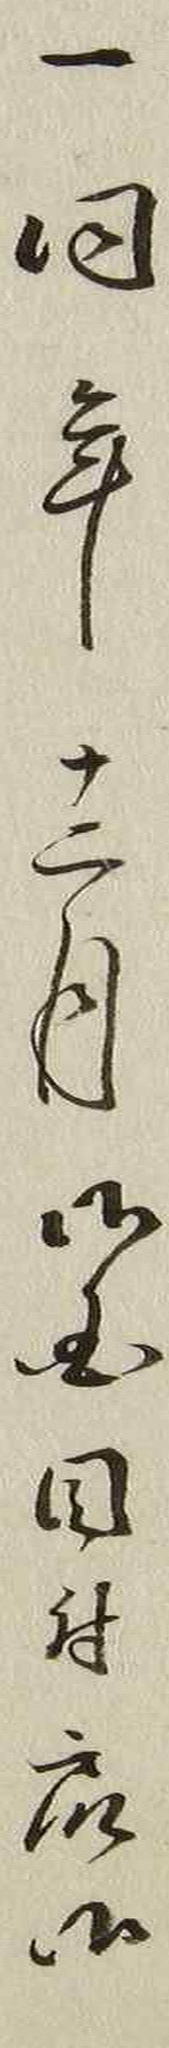一同年十二月御国目付衆御
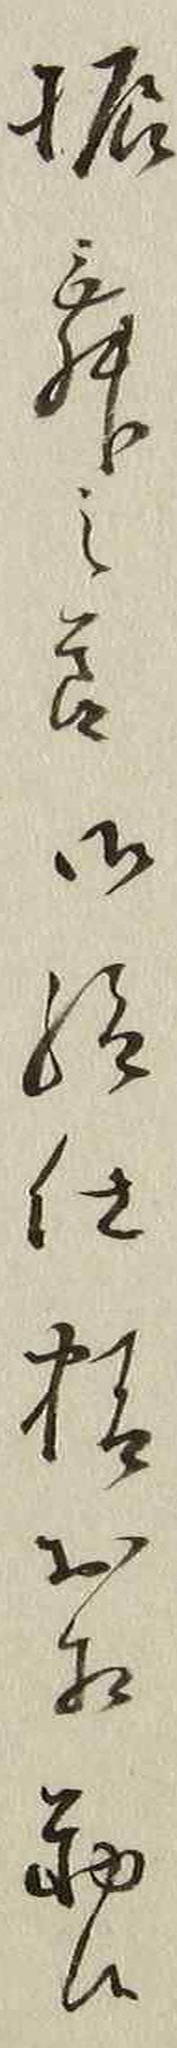振舞之節御給仕精出相勤候
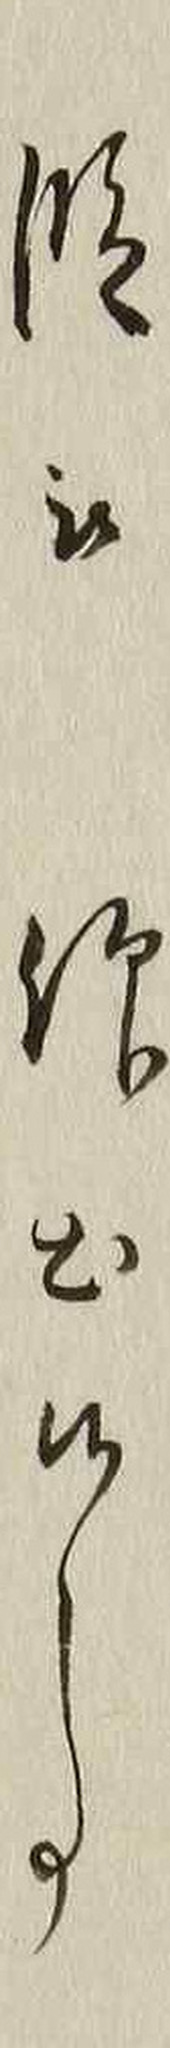段被仰出候事
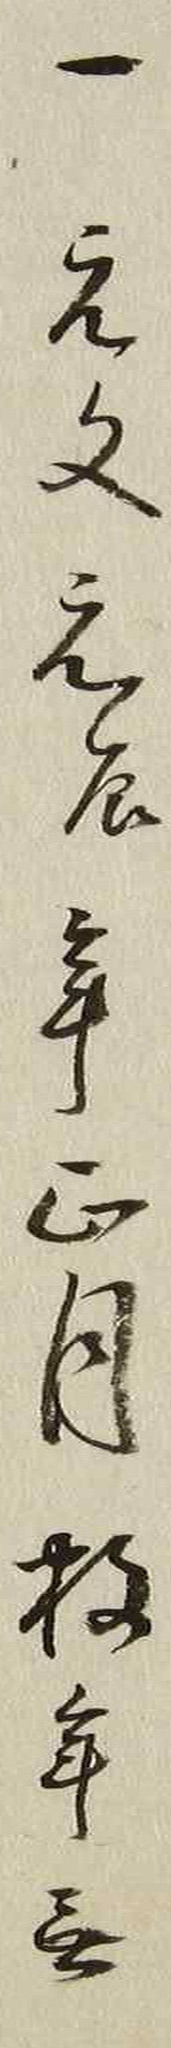一元文元辰年正月枚年無
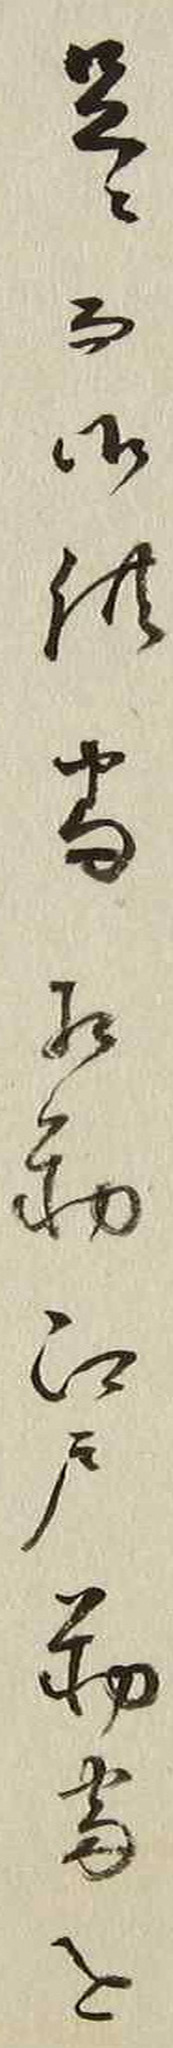足に而御供番相勤江戸勤番を
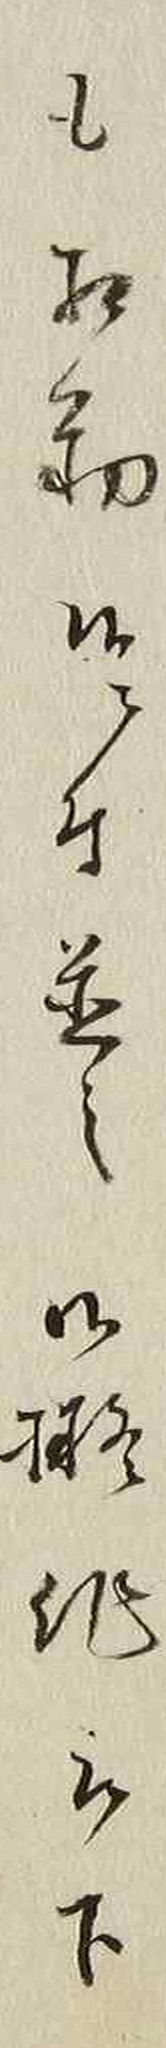も相勤候に付御擬作被下
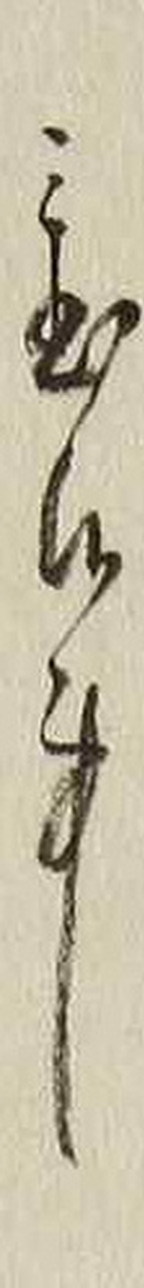置候事
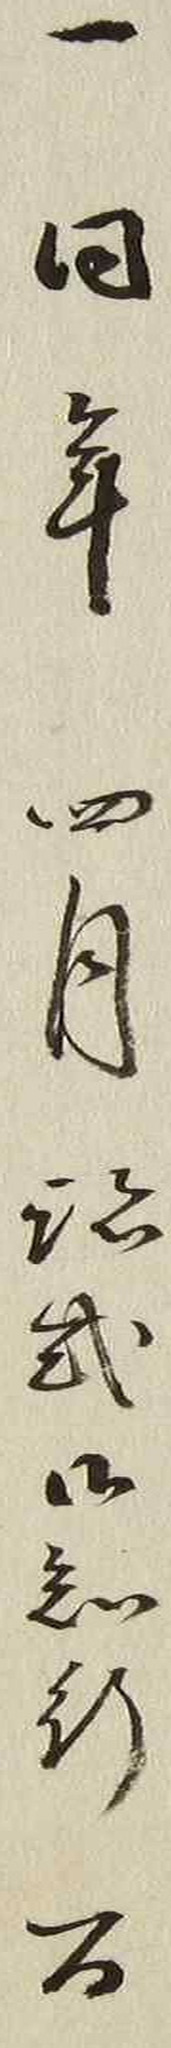一同年四月跡或御知行百
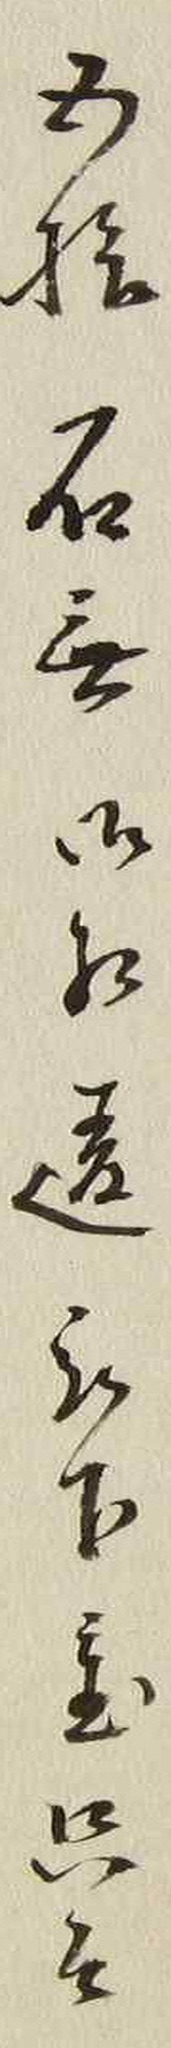五拾石無御相違被下置只今
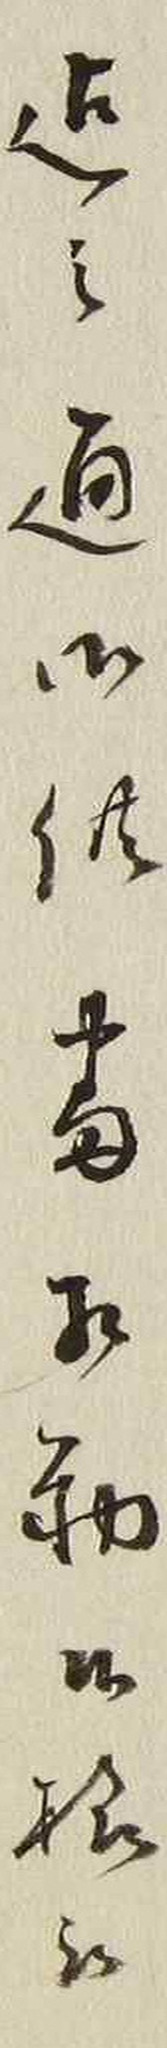迄之通御供番相勤候様被
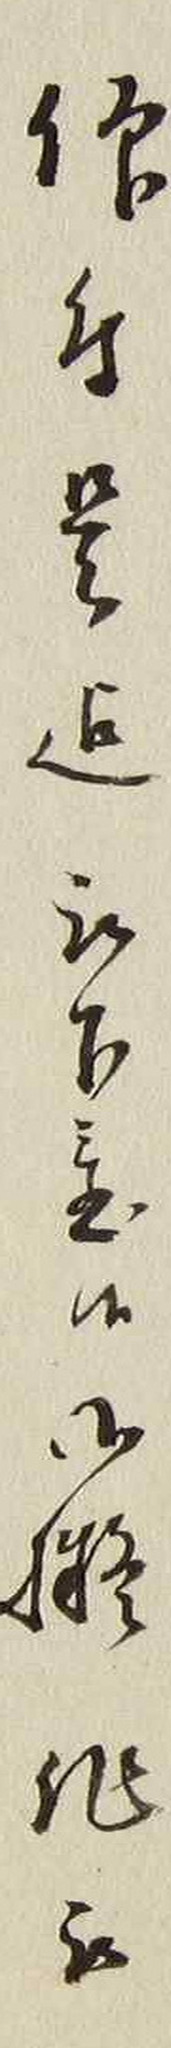仰付是迄被下置候御擬作被
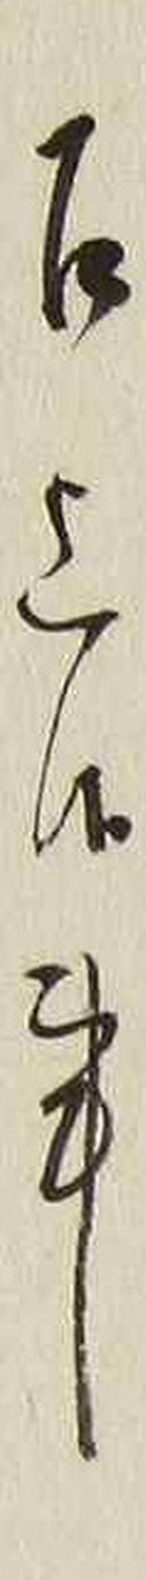召上候事
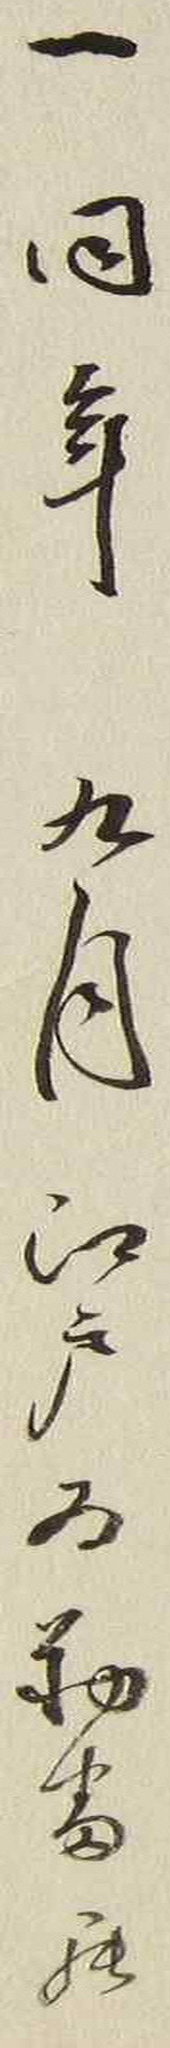一同年九月江戸為勤番罷
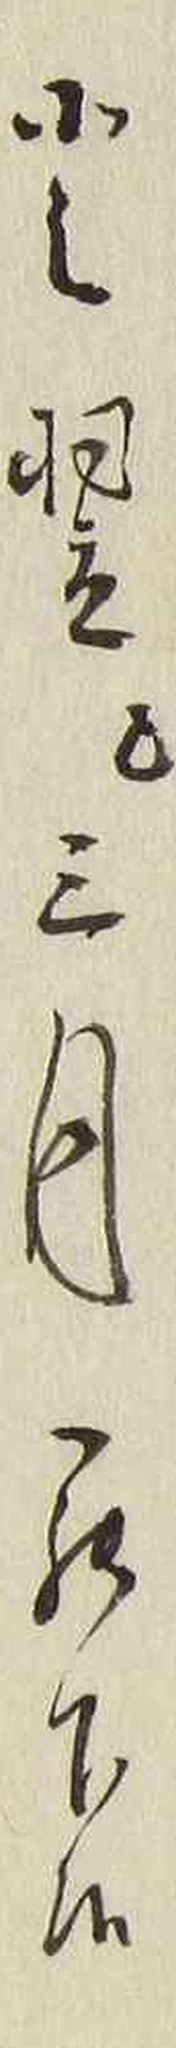登翌巳三月罷下候

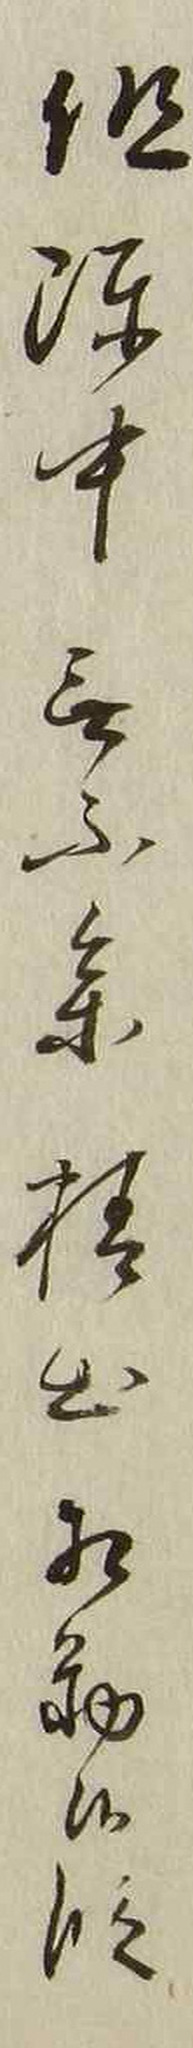但陣中無不参精出相勤候段
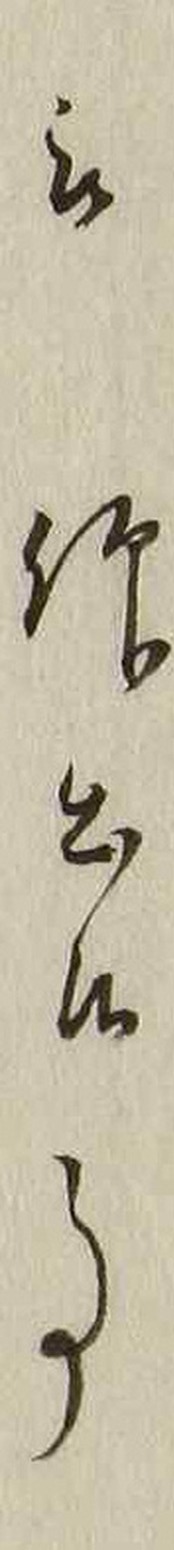被仰出候事
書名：諸士系譜　巻之159　な之部1
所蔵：会津若松市立会津図書館
